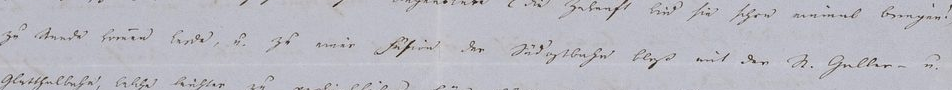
zu Stande kommen werde, u. zu einer Fusion der Südostbahn bloß mit der St. Galler- u.
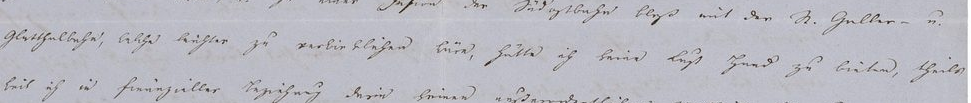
Glatthalbahn , welche leichter zu verwirklichen wäre, hätte ich keine Lust Hand zu bieten, theils
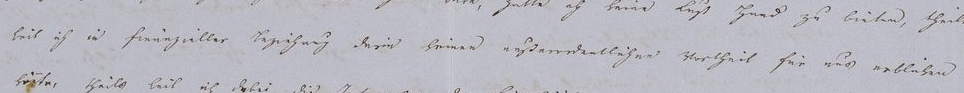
weil ich in finanzieller Beziehung darin keinen außerordentlichen Vortheil für uns erblicken
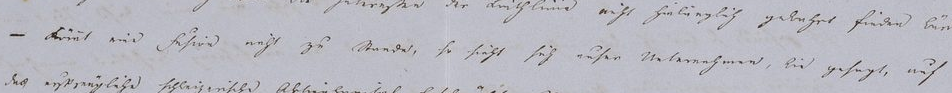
– Kömmt eine Fusion nicht zu Stande, so sieht sich unser Unternehmen, wie gesagt, auf
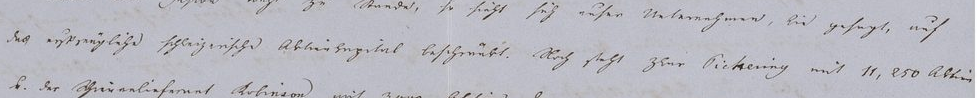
das ursprüngliche schweizerische Aktienkapital beschränkt. Noch steht zwar Pickering mit 11,250 Aktien
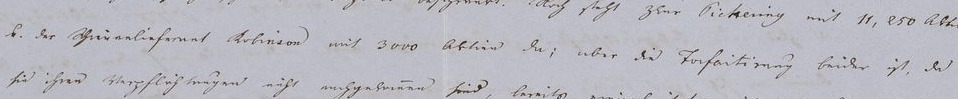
u. der Schienenlieferant Robinson mit 3000 Aktien da; aber die Forfaitirung beider ist, da
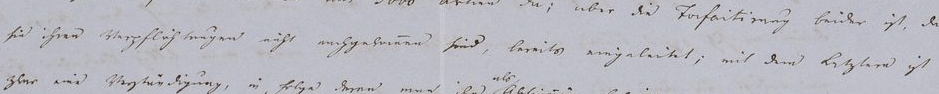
sie ihren Verpflichtungen nicht nachgekommen sind, bereits eingeleitet; mit dem Letztern ist
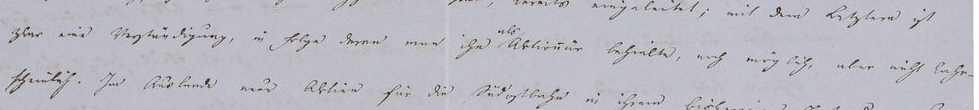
zwar eine Verständigung, in Folge deren man ihn als Aktionnär behielte, noch möglich, aber nicht wahr-
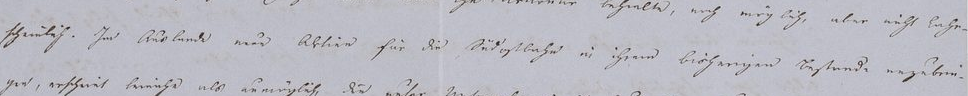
scheinlich. Im Auslande neue Aktien für die Südostbahn in ihrem bisherigen Bestande anzubrin-
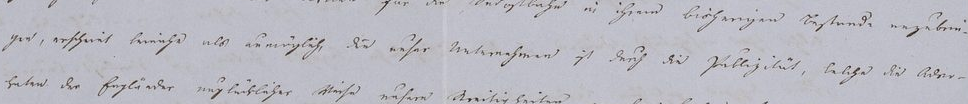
gen, erscheint beinahe als unmöglich, denn unser Unternehmen ist durch die Publizität, welche die Advo-
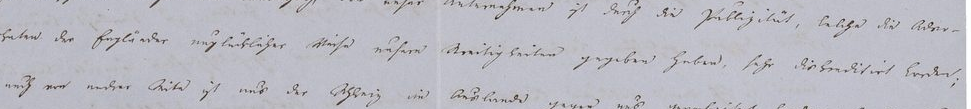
katen der Engländer unglücklicher Weise unsern Streitigkeiten gegeben haben, sehr diskreditirt worden;
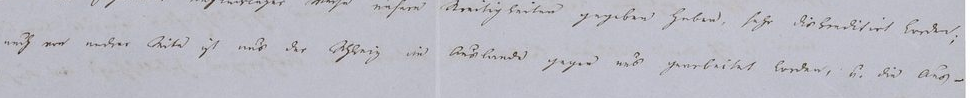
auch von andrer Seite ist aus der Schweiz im Auslande gegen uns gearbeitet worden u. die Aus-
